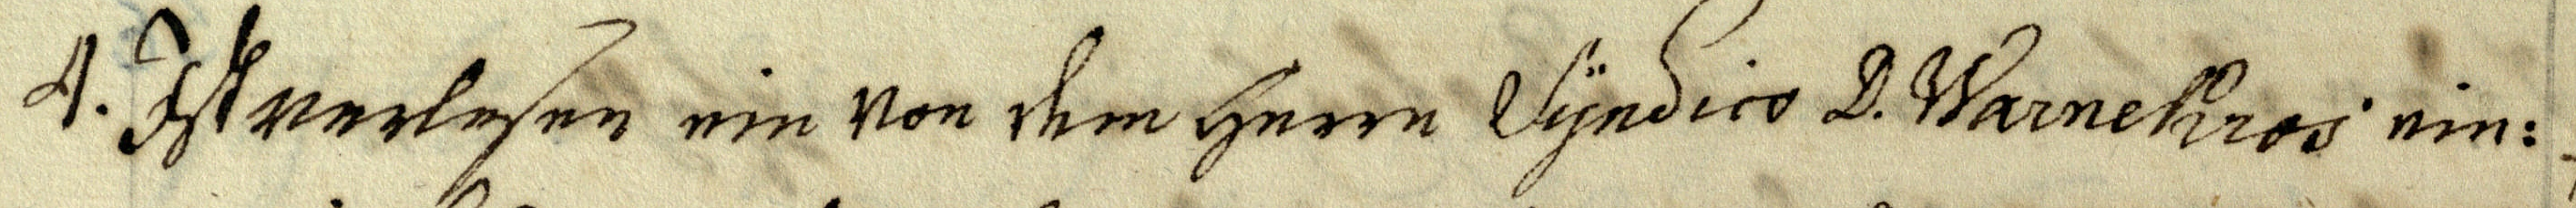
4. Ist verlesen ein von dem Herrn Sÿndico D. Warnekros ein¬
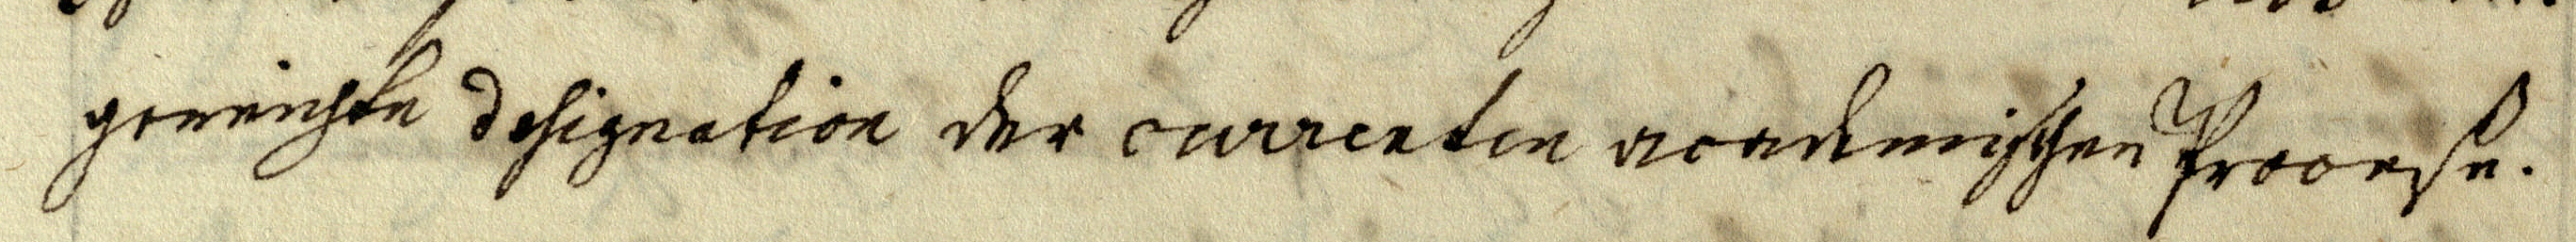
gereichte designation der currenten academischen Proceße.
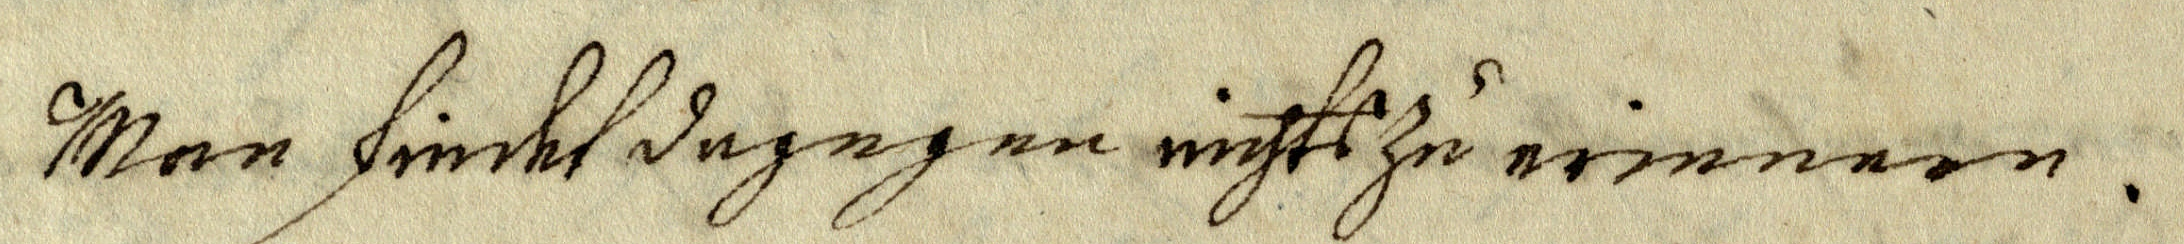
Man findet dagegen nichts zu erinnern.
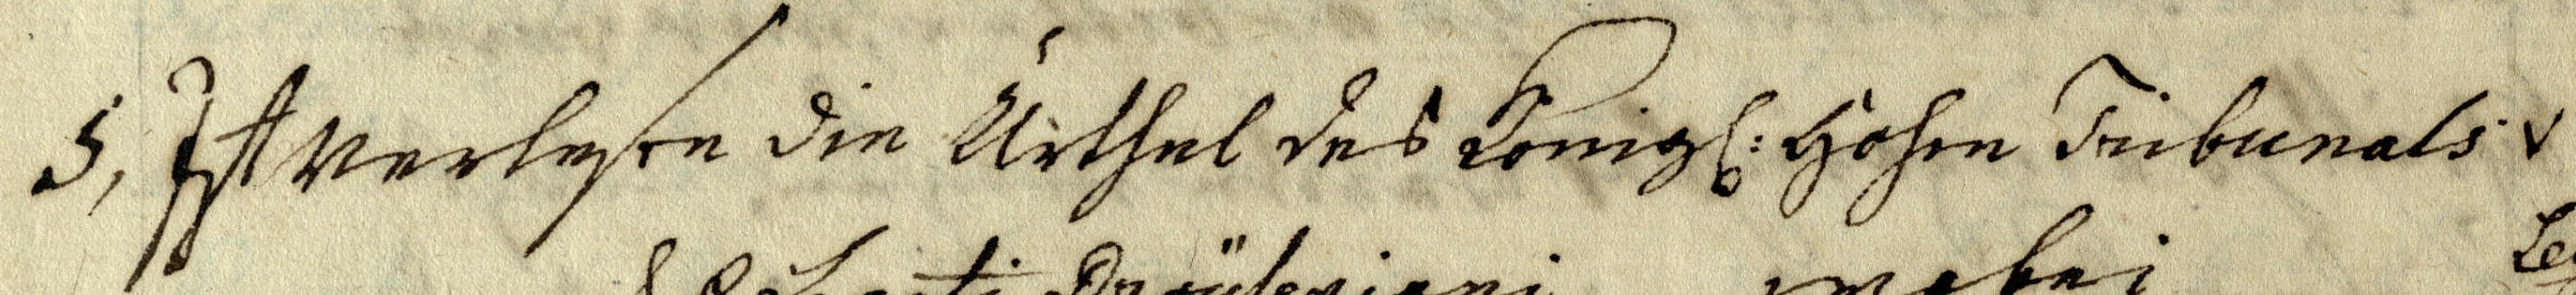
5, Ist verlesen die Urthel des Königl. Hohen Tribunals
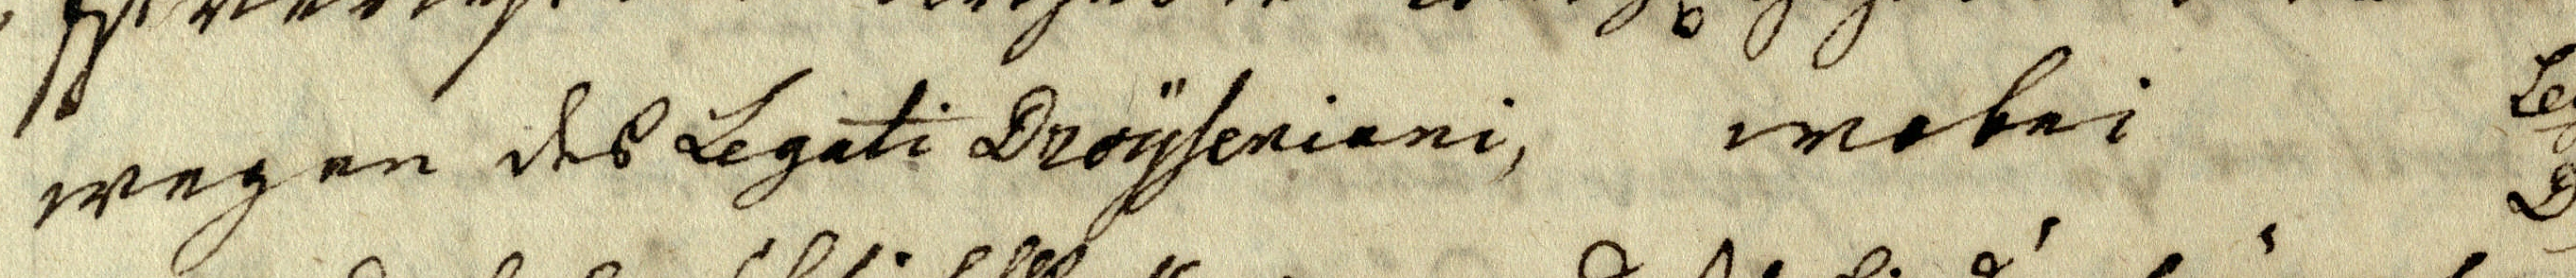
wegen des Legati Droÿseniani, wobei
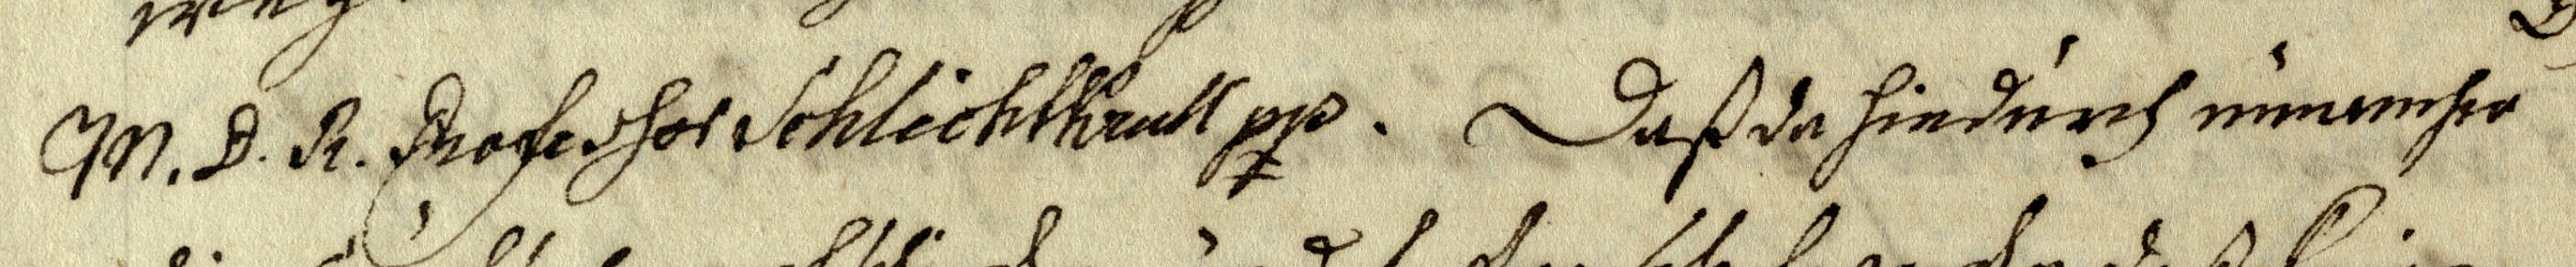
M. D. R. Professor Schlichtkrull pp. Daß da hiedurch nunmehro
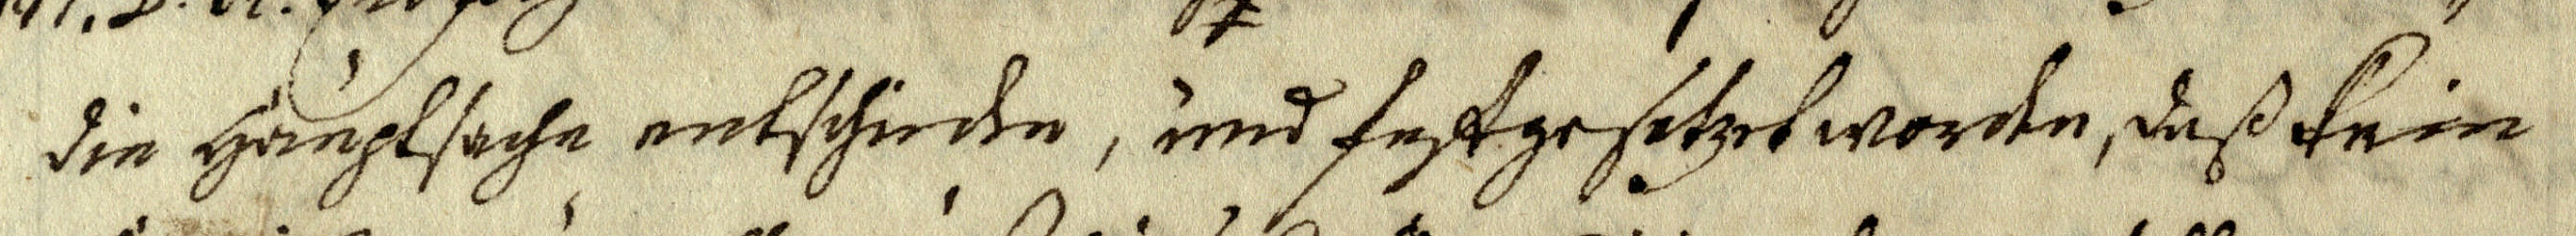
die Hauptsache entschieden, und festgesetzet worden, daß kein
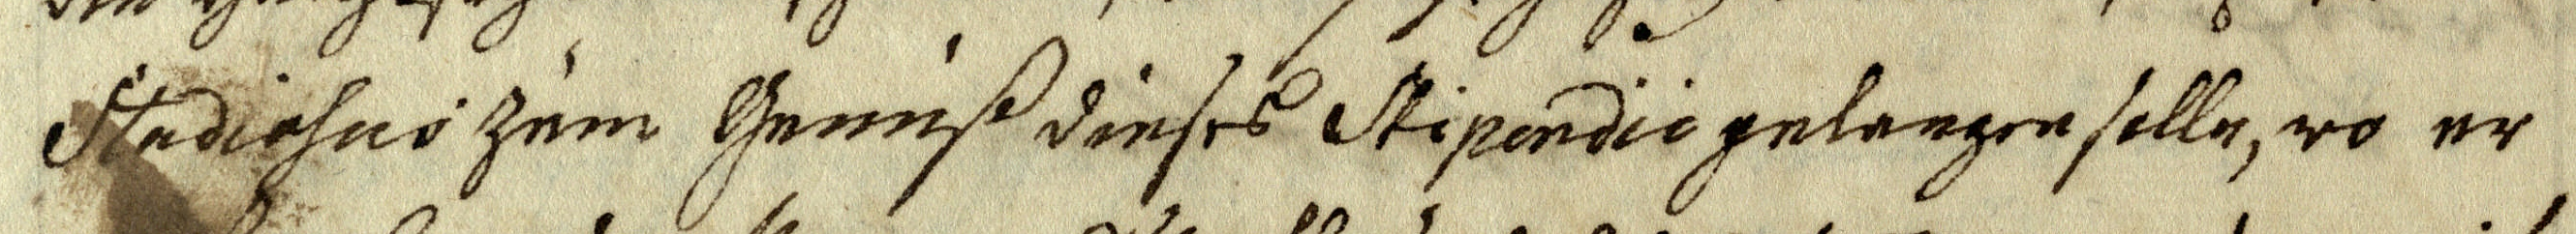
Studiosus zum Genuß dieses Stipendii gelangen solle, wo er
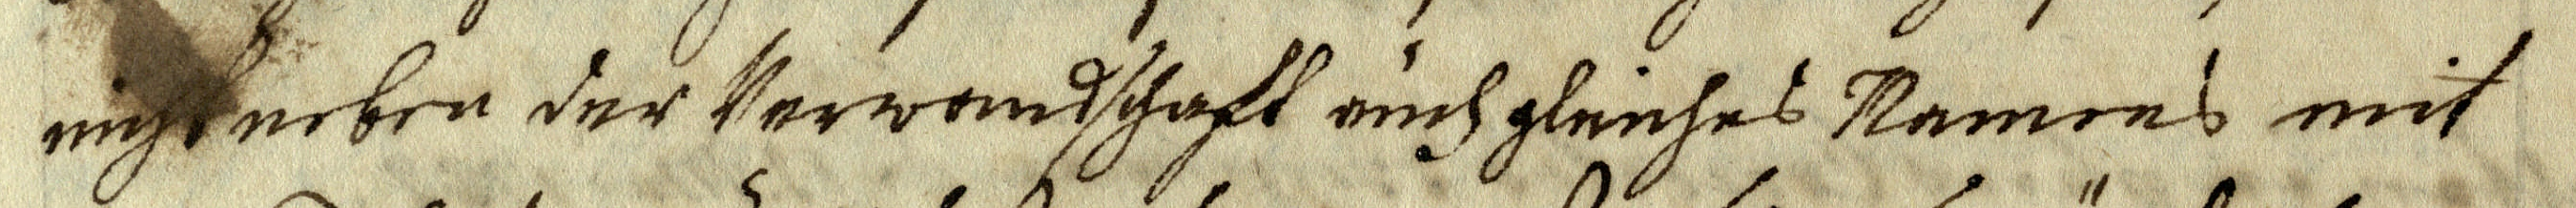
nicht neben der Verwandschaft auch gleiches Namens mit
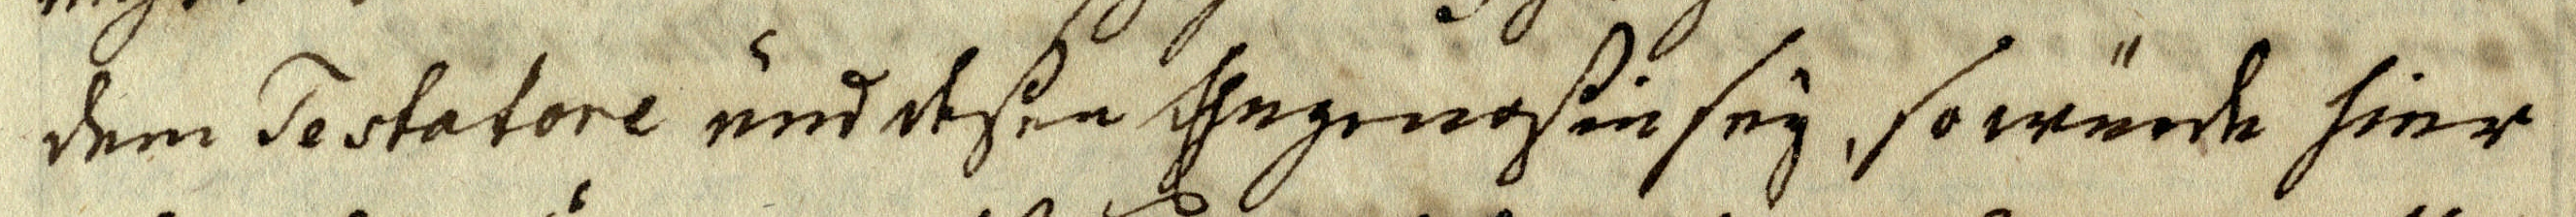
dem Testatore und deßen Ehegenoßin seÿ, so würde hier
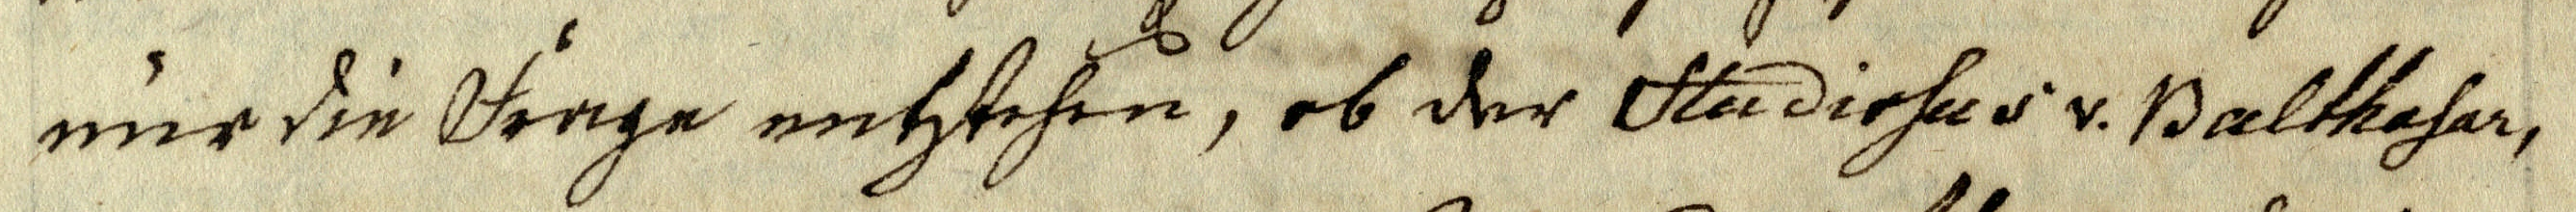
nur die Frage entstehen, ob der Studiosus v. Balthasar,
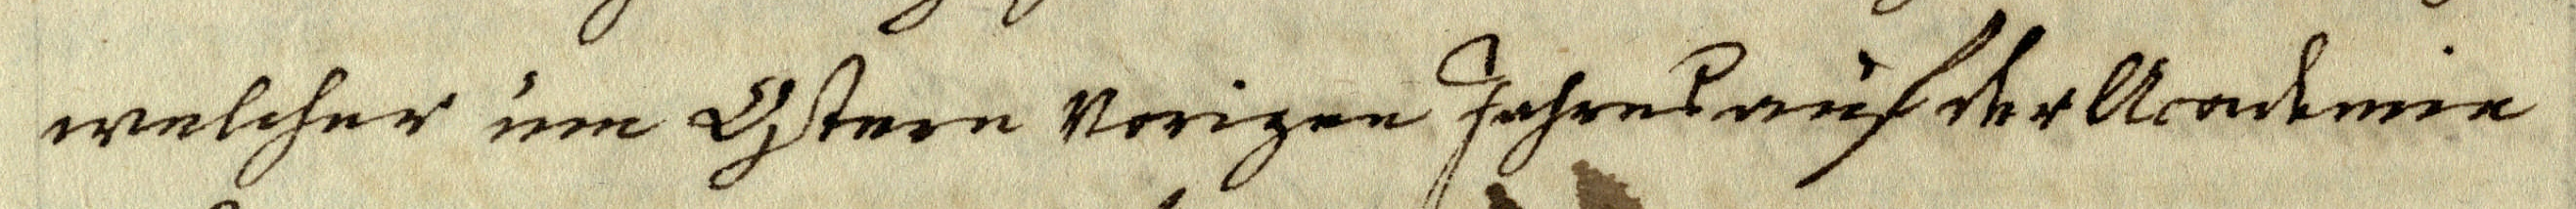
welcher um Ostern vorigen Jahres auf der Academie
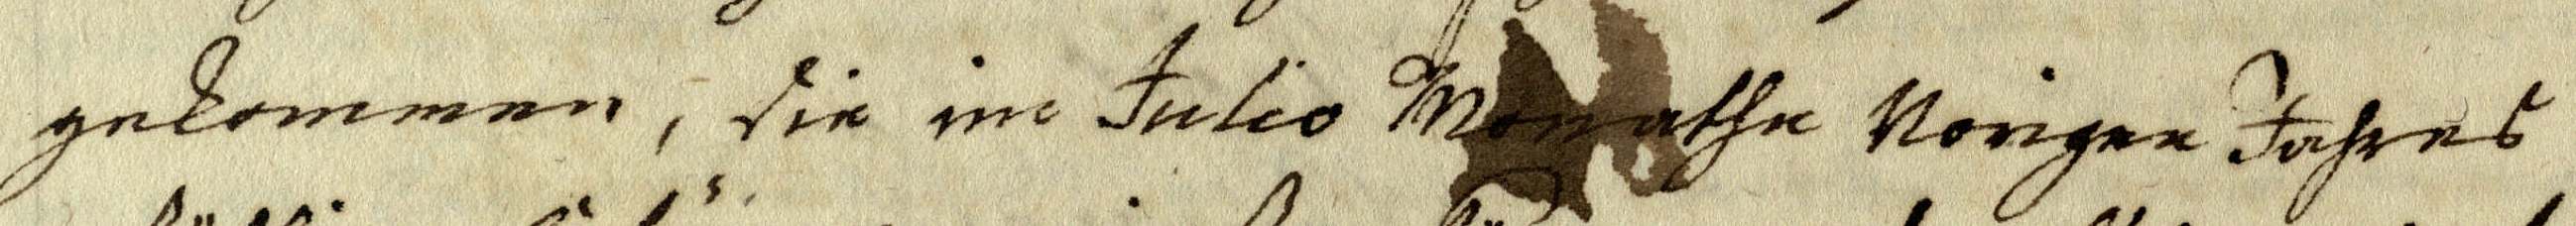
gekommen, die im Julio Monathe vorigen Jahres
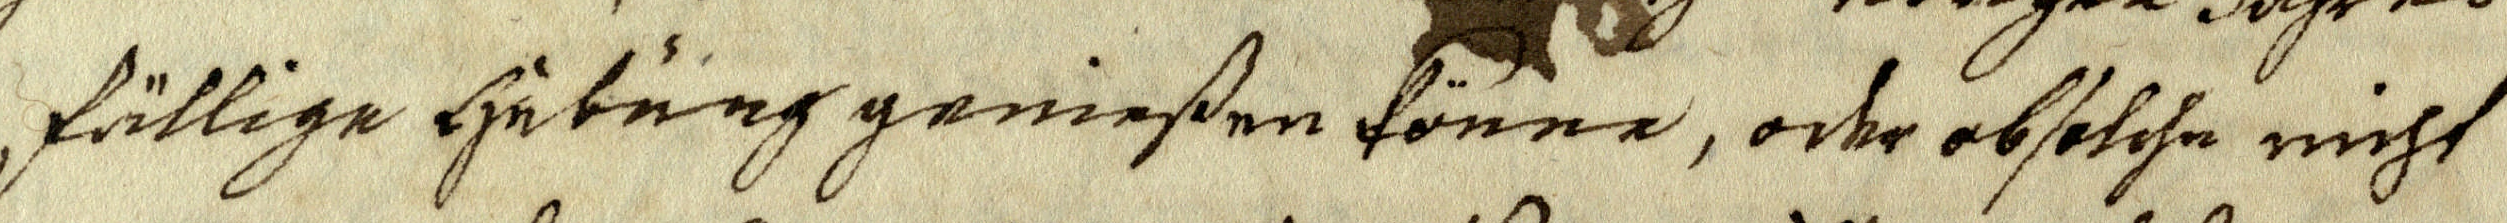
fällige Hebung genießen könne, oder ob solche nicht
